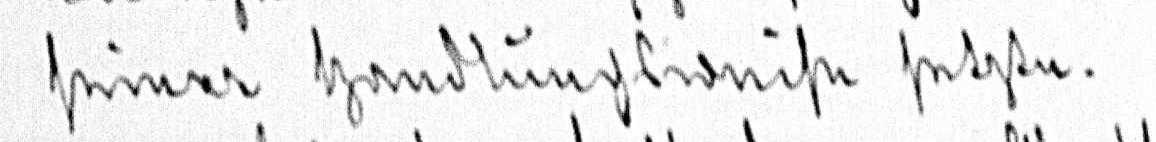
seiner Handlungsweise setzte.
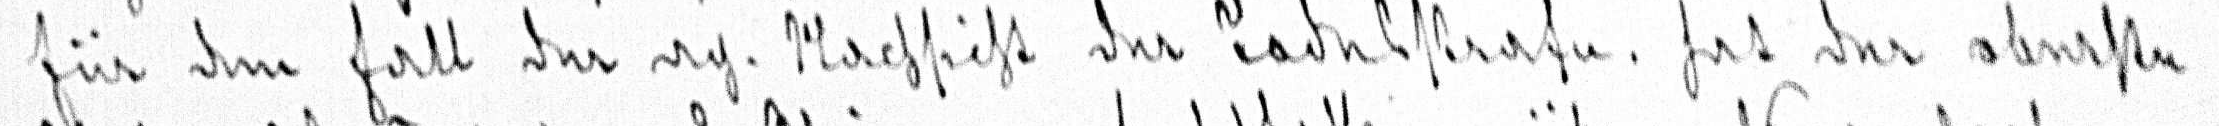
Für den Fall der ag. Nachsicht der Todesstrafe, hat der oberste
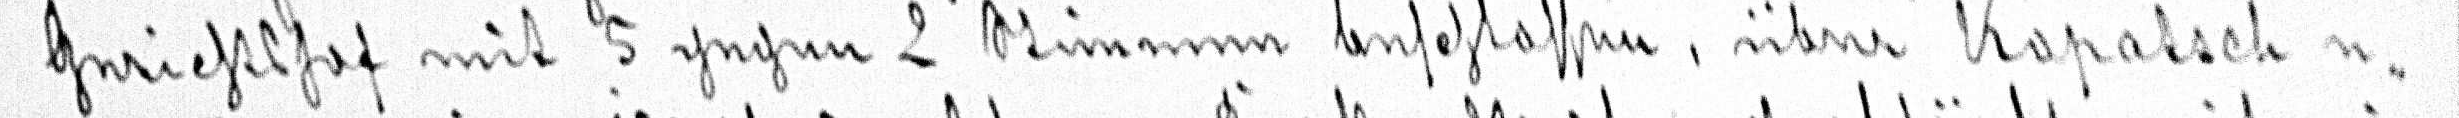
Gerichtshof mit 5 gegen 2 Stimmen beschlossen, über Kopatsch e¬
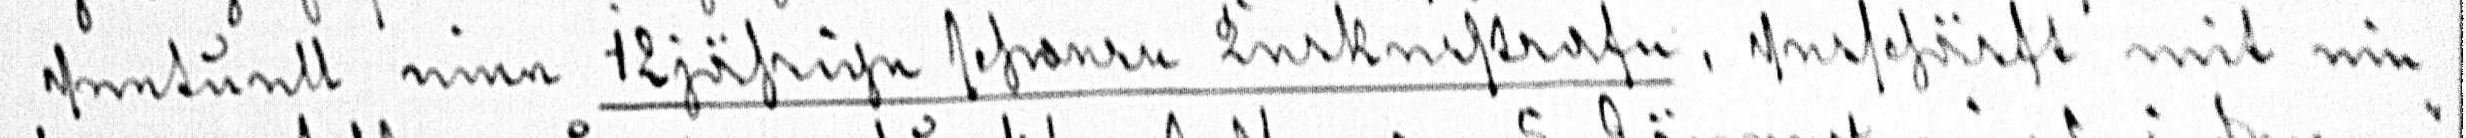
ventuell eine 12jährige schwere Kerkerstrafe, verschärft mit ein¬
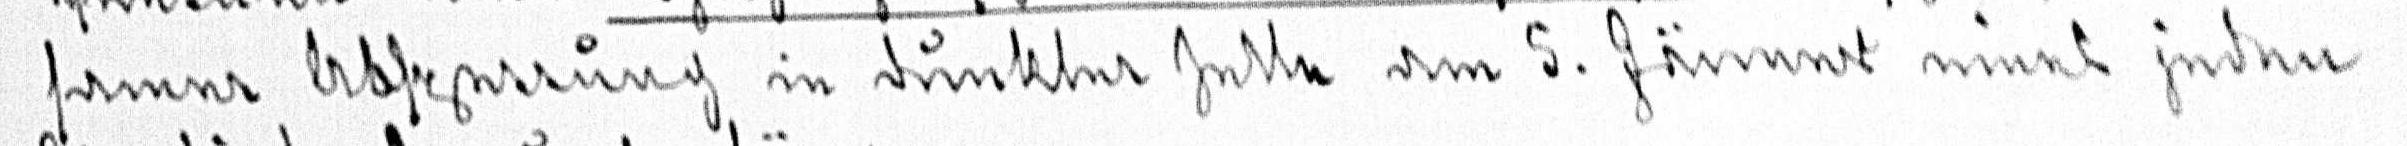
samer Absperrung in dunkler Zelle am 5. Jänner eines jeden
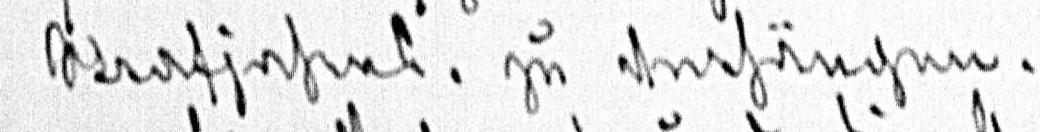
Strafjahres, zu verschärfen.
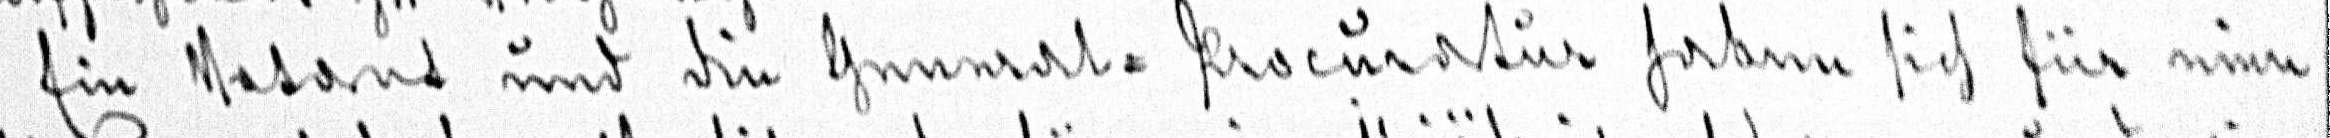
Ein Votant und die General-Procuratur haben sich für eine
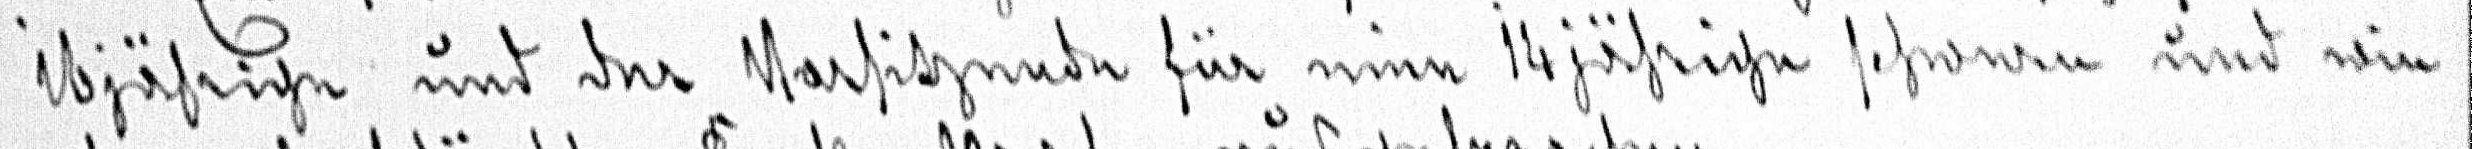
16 jährige und der Vorsitzende für ein 14jährige schwere und wie
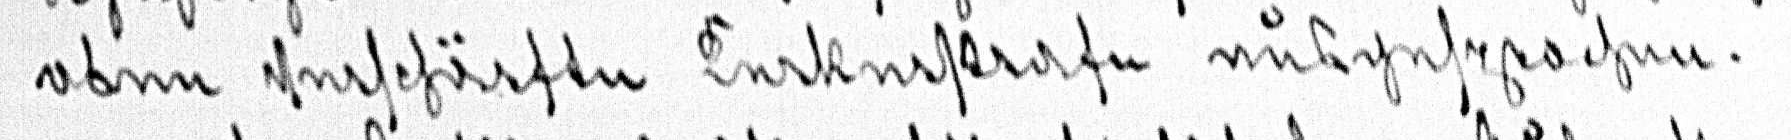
oben verschärfte Kerkerstrafe ausgesprochen.
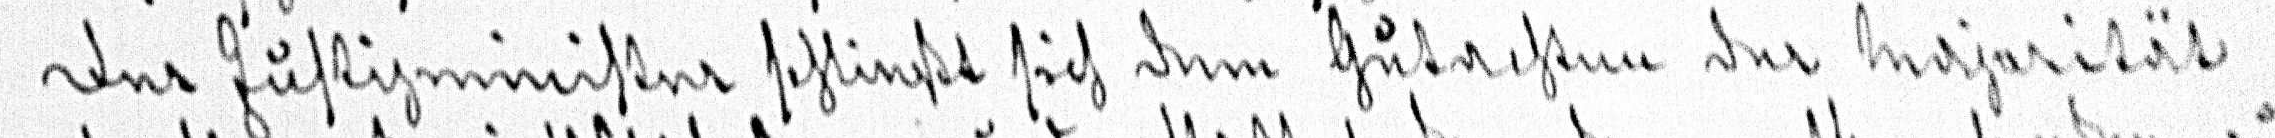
Der Justizminister schließ sich dem Gutachten der Majorität
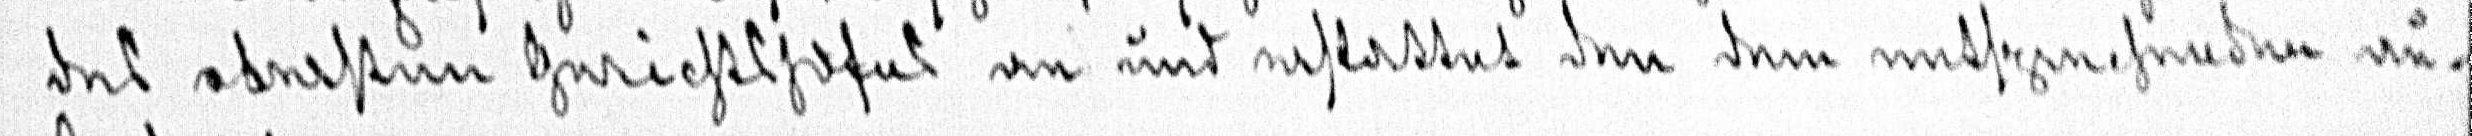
des obersten Gerichtshofes an und erstattet den dem entsprechenden au.
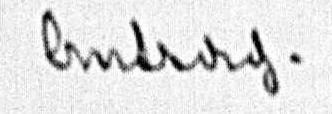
Antrag.
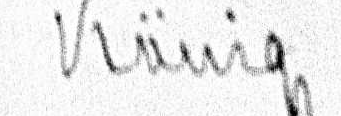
König
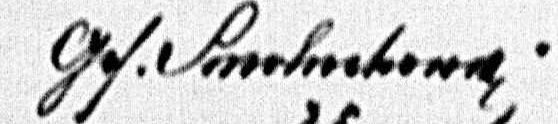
Ges. Smolenkow
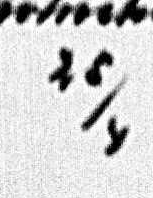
25/4
